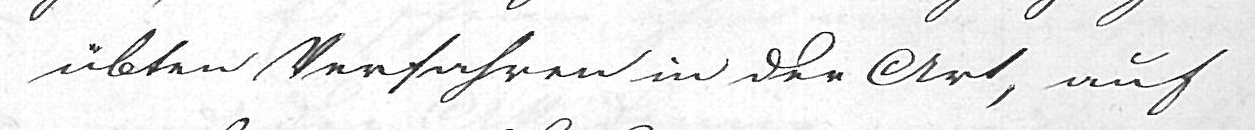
übten Verfahren in der Art, auf
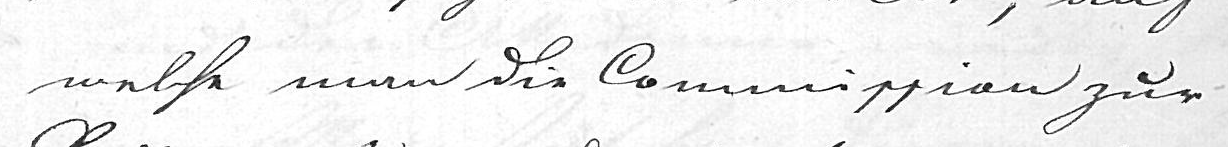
welche man die Commission zur
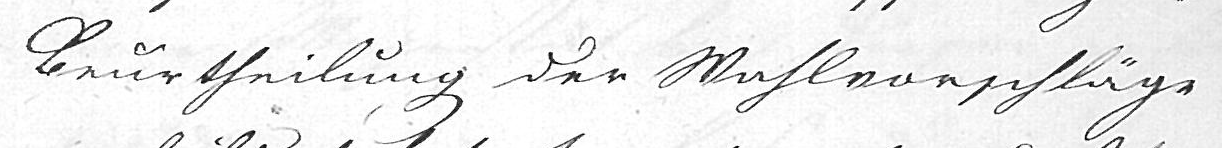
Beurtheilung der Wahlvorschläge
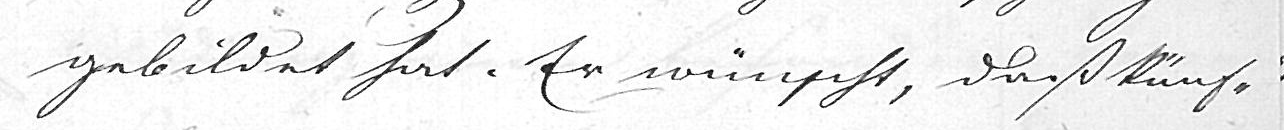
gebildet hat. Er wünscht, daß künf-
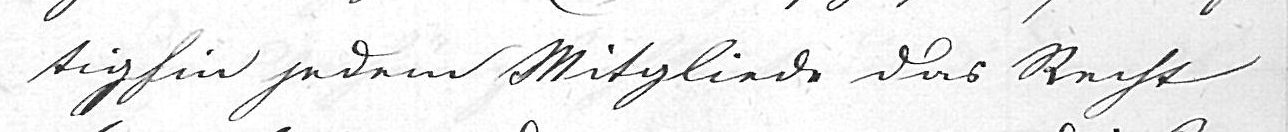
ighin jedem Mitgliede des Recht
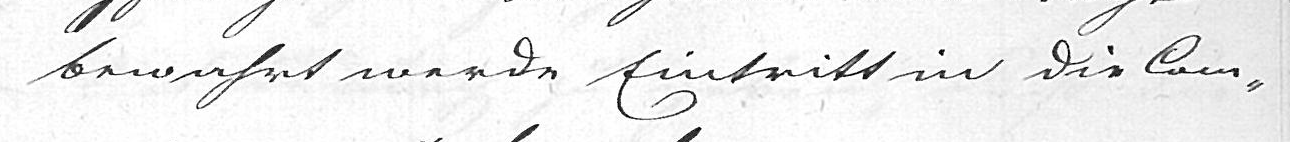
bewahrt werde Eintritt in die Com-
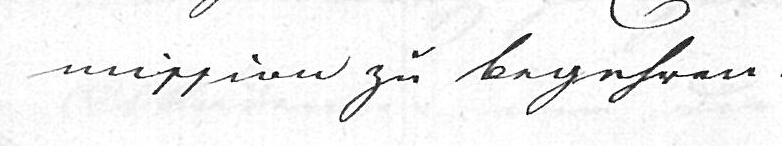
mission zu begehren.
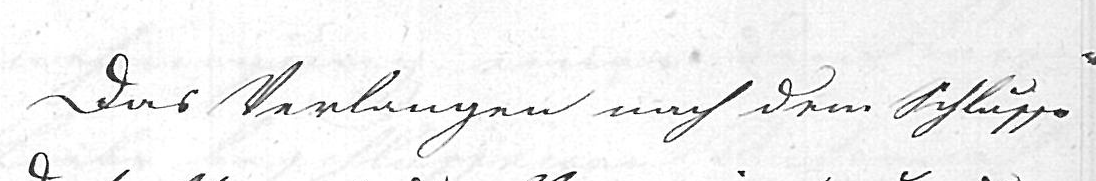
Das Verlangen nach dem Schlusse
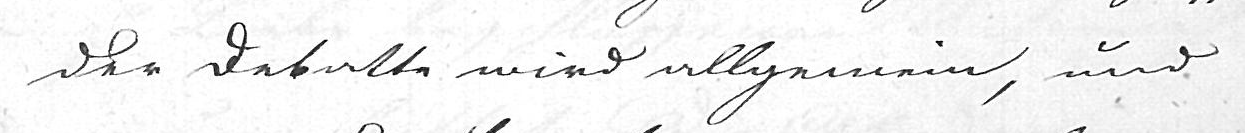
der Debatte wird allgemein, und
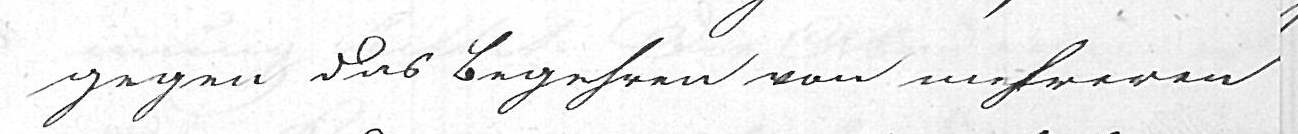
gegen das Begehren von mehreren
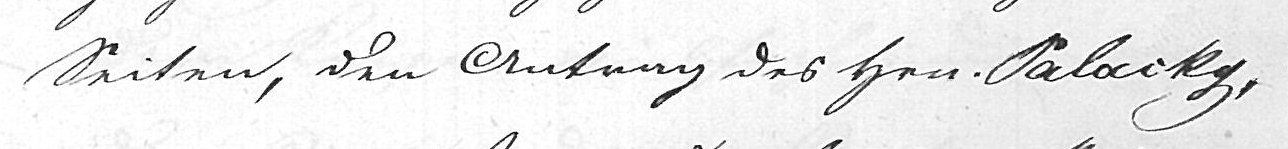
Seiten, den Antrag des Hrn. Palacky,
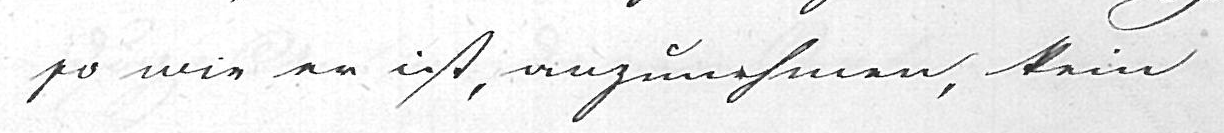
so wie er ist, anzunehmen, kein
